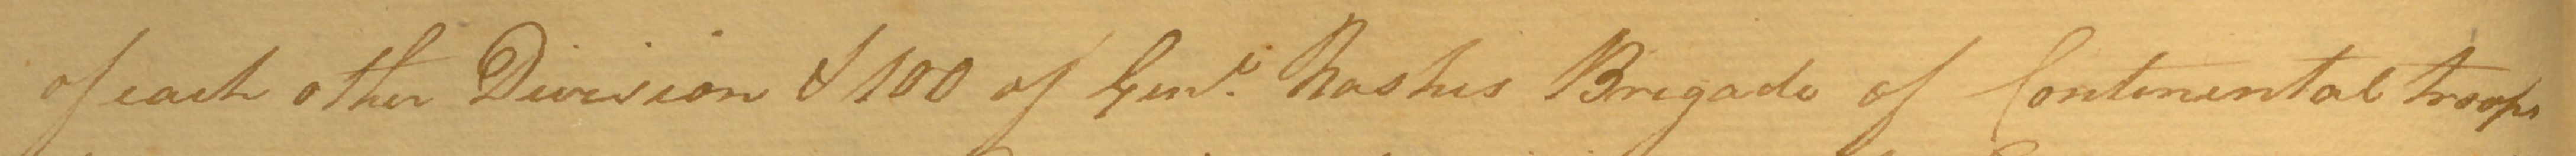of each other Division & 100 of Gen^l Nashes Brigade of Continental troops
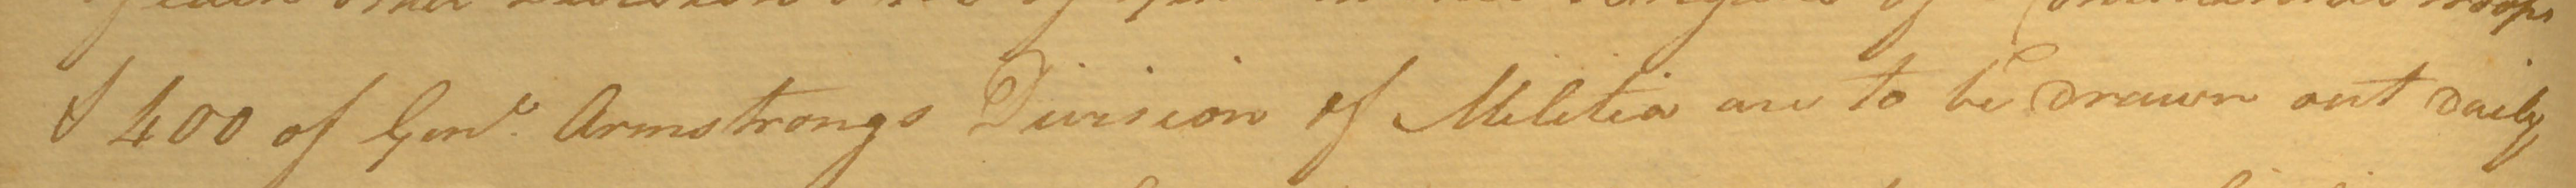& 400 of Gen^l. Armstrongs Division of Militia are to be drawn out daily
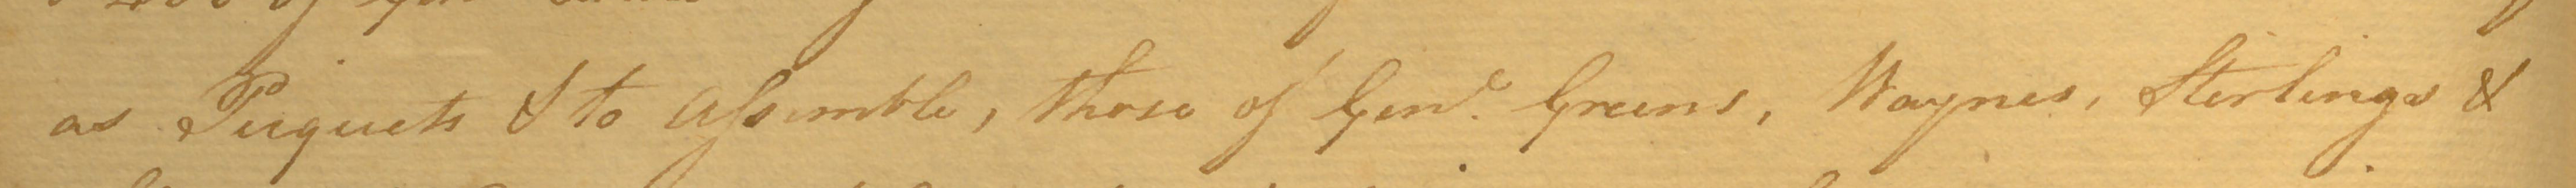as Picquets & to Assemble, those of Gen^l. Greens, Waynes, Stirlings &
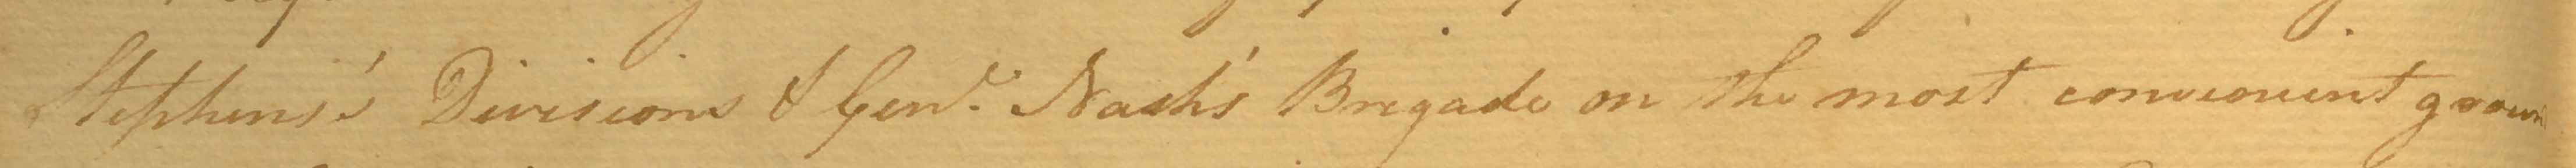Stephens's Divisions & Gen^l. Nash's Brigade on the most convenient ground
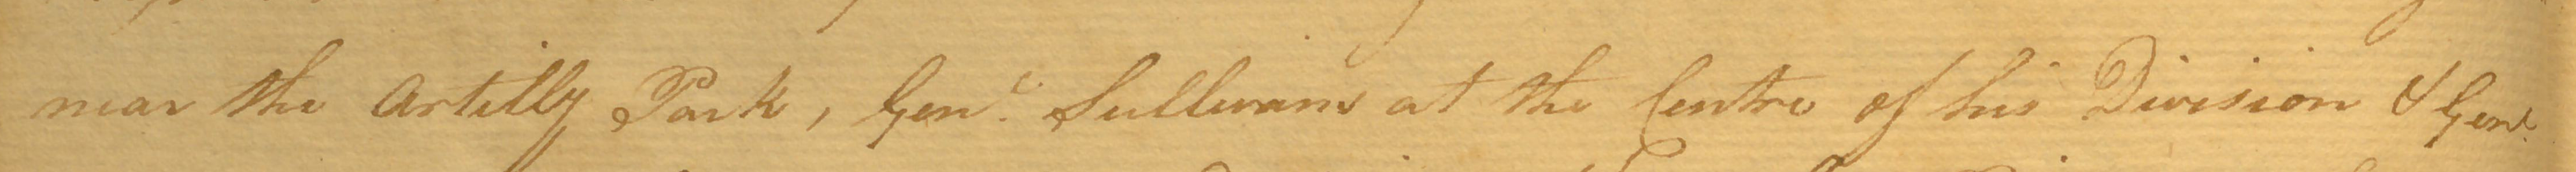near the Artilly Park, Gen^l. Sullivans at the Centre of his Division & Gen^l.
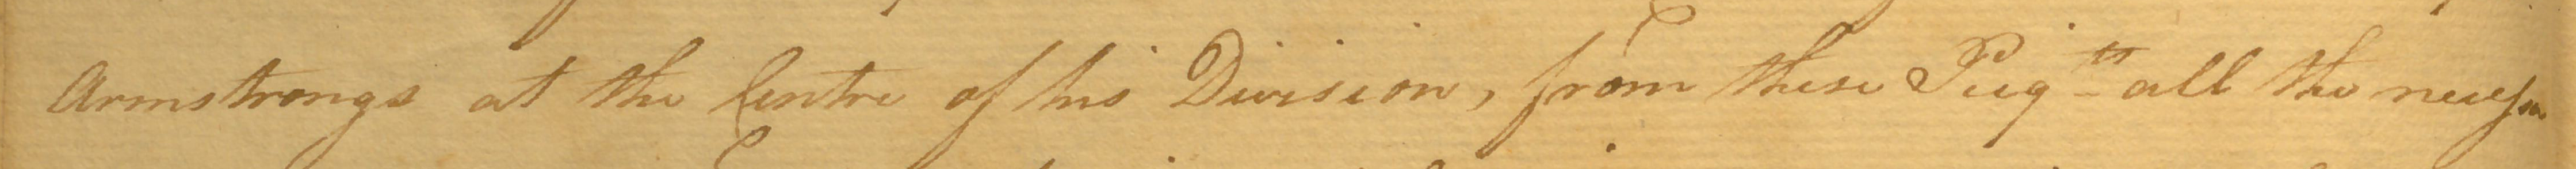Armstrongs at the Centre of his Division, from these Picq^ts all the necessa
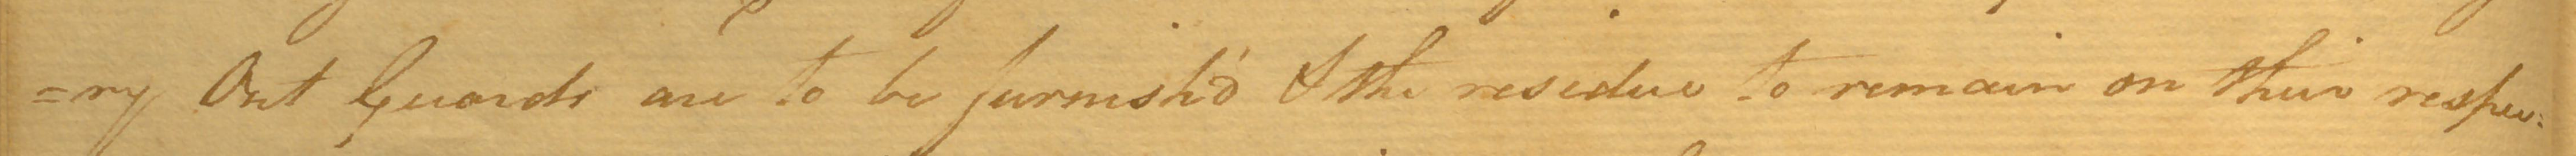-ry Out Guards are to be furnish'd & the residue to remain on their respec-
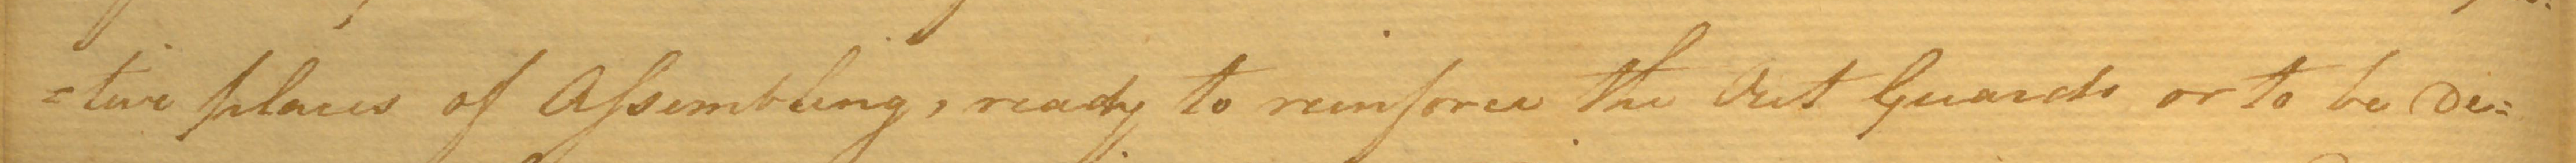-tive places of Assembling, ready to reinforce the Out Guards or to be de-
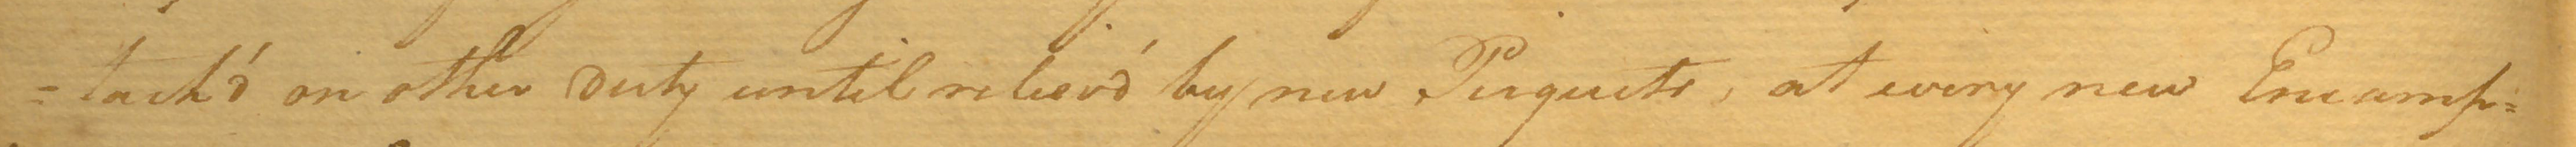-tach'd on other duty until reliev'd by new Picquets, at every new Encamp-
